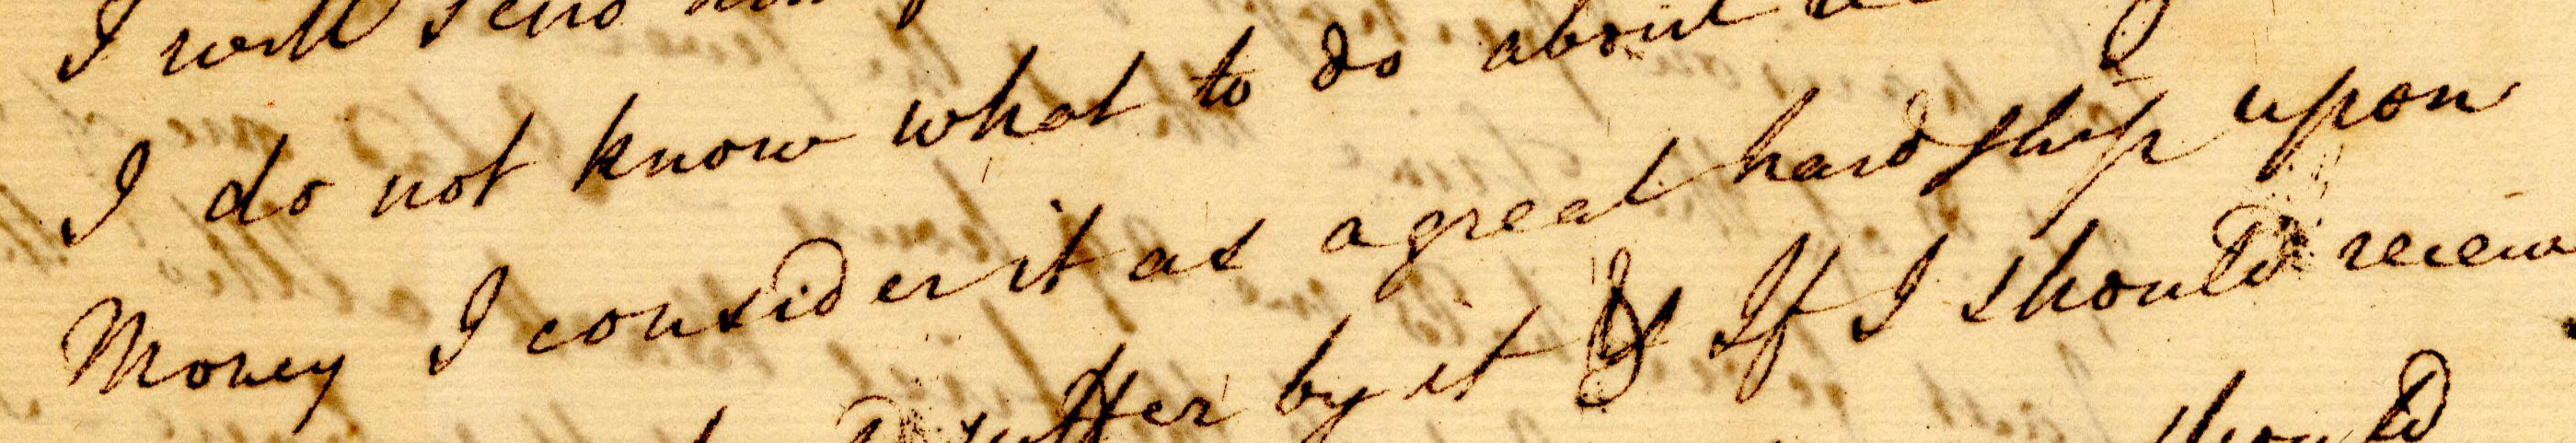Money I consider it as a great hardship upon
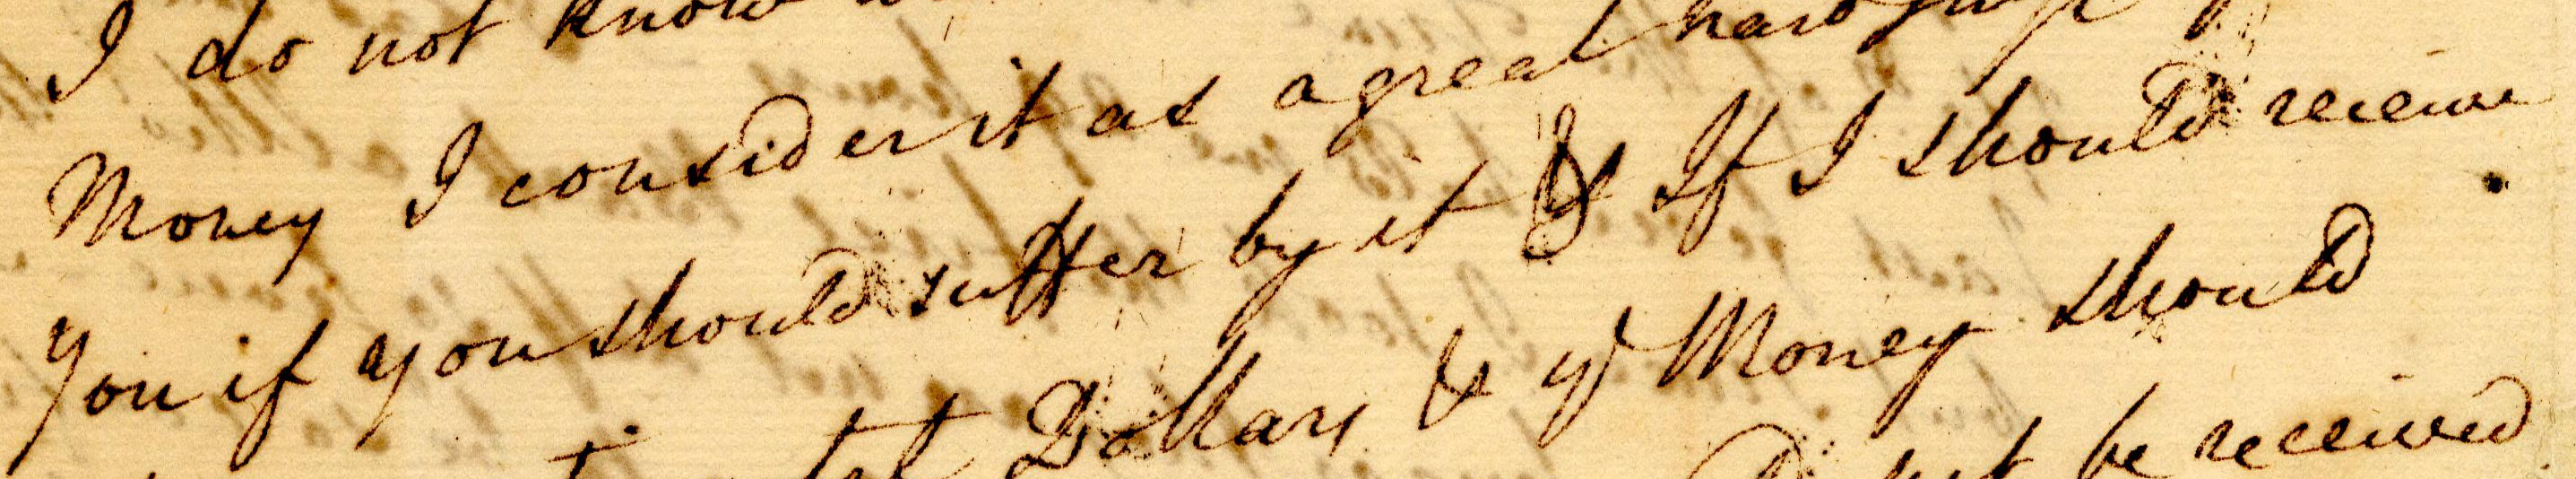You if you should suffer by it & If I should receive
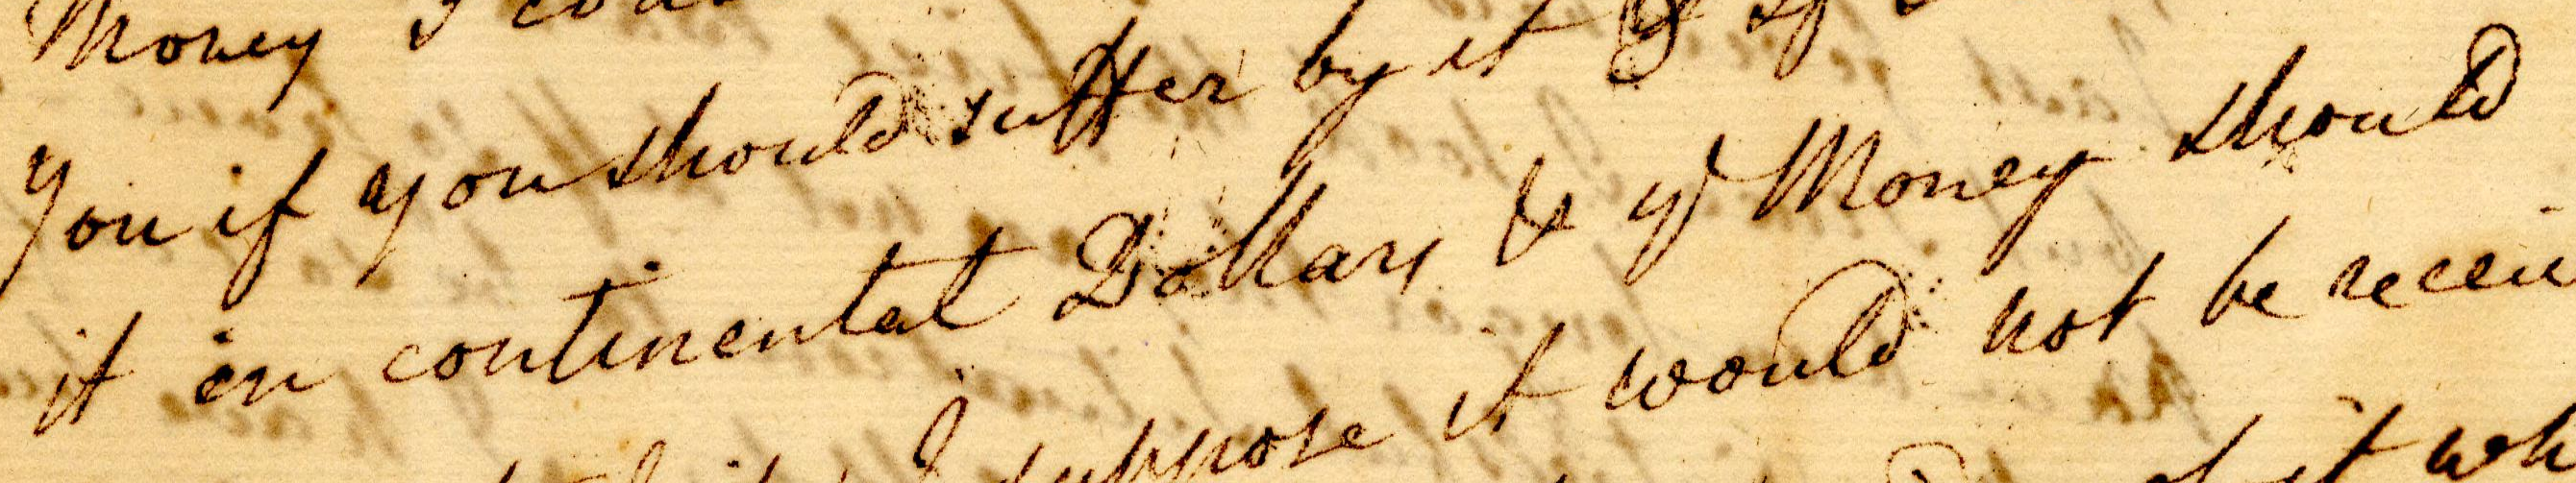it in continental Dollars & y^e Money should
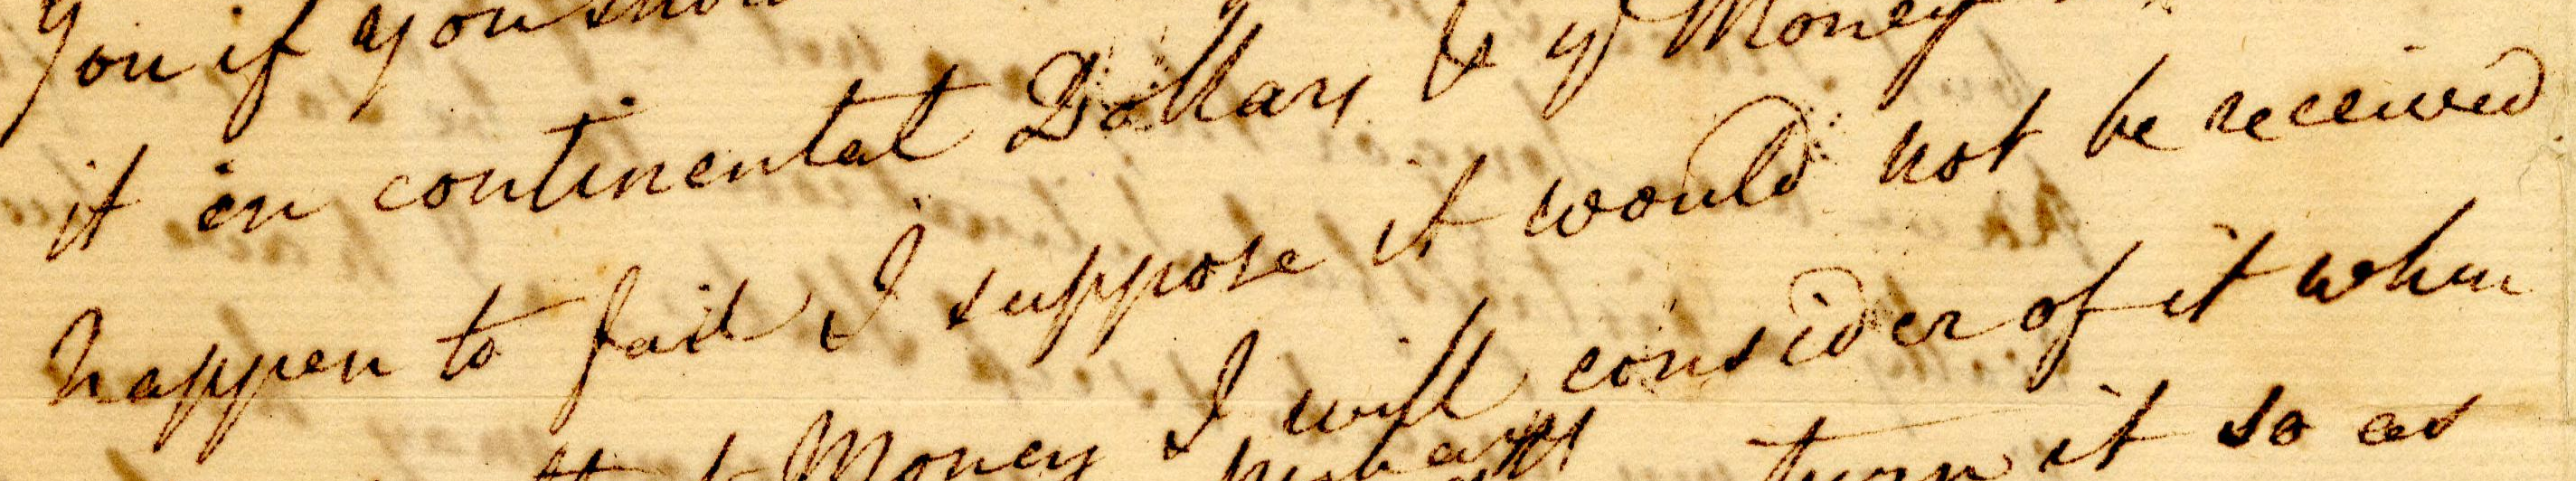happen to fail I suppose it would not be received
